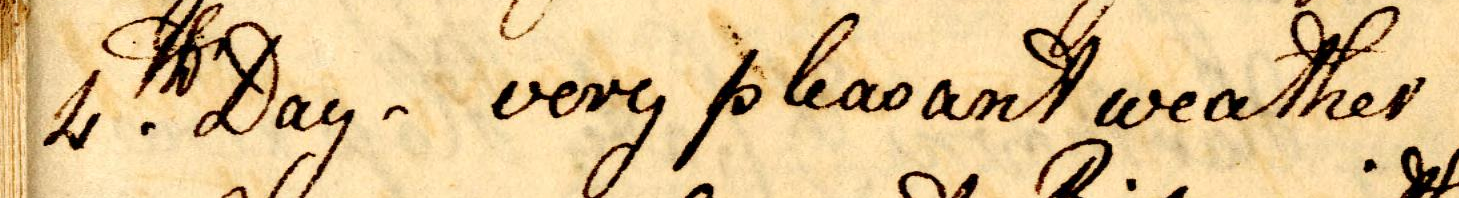4^th. Day- very pleasant weather
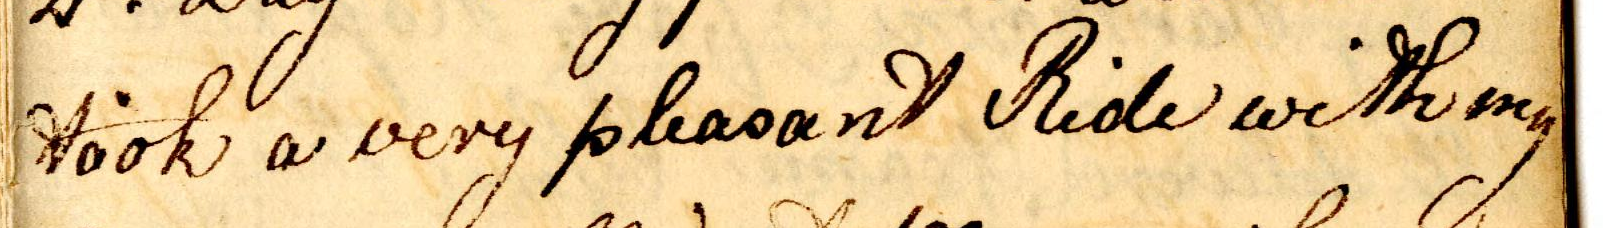took a very pleasant Ride with my
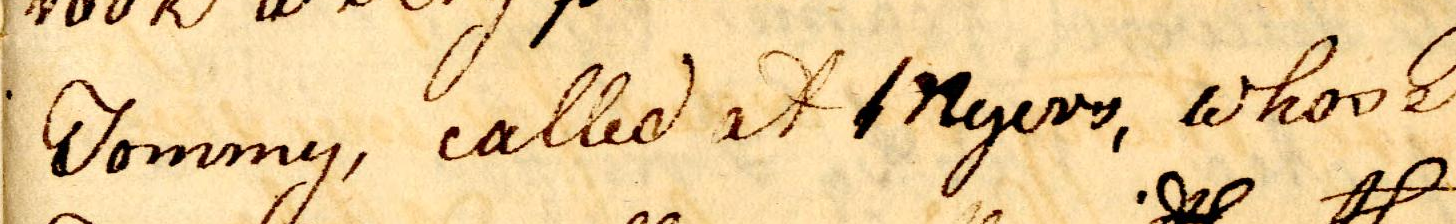Tommy, called at Myers, whose
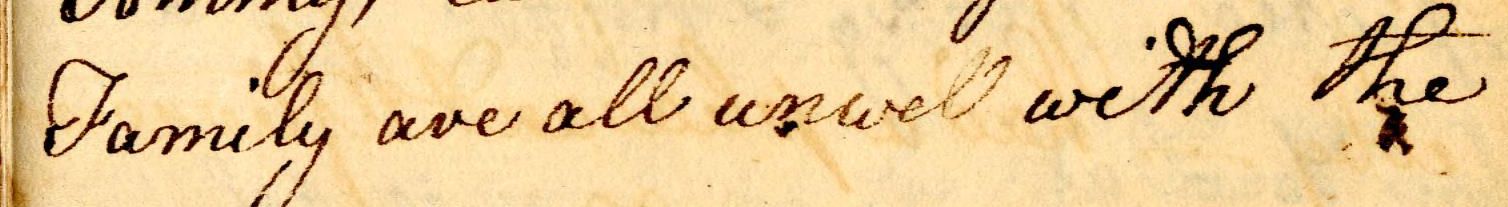Family are all unwell with the
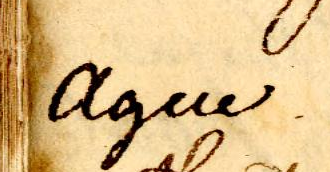Ague
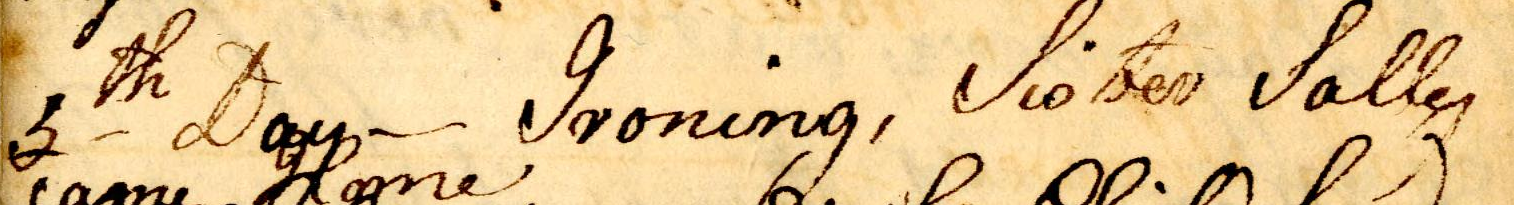5^th Day- Ironing, Sister Sally
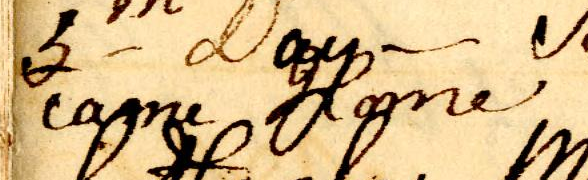came Home
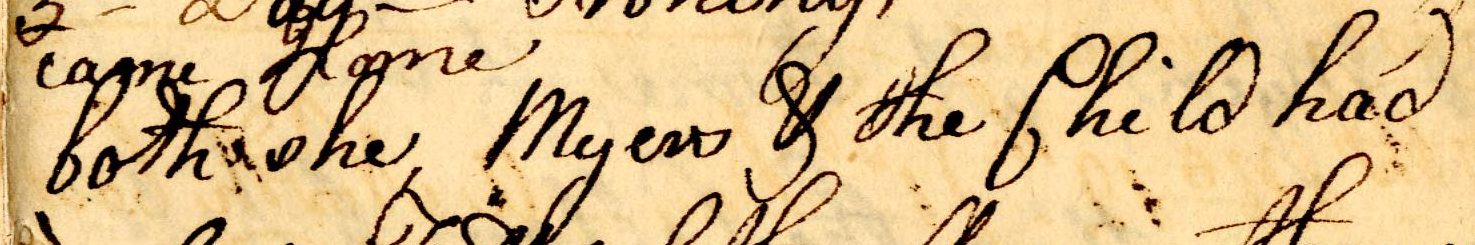both ^ she, Myers & the Child had
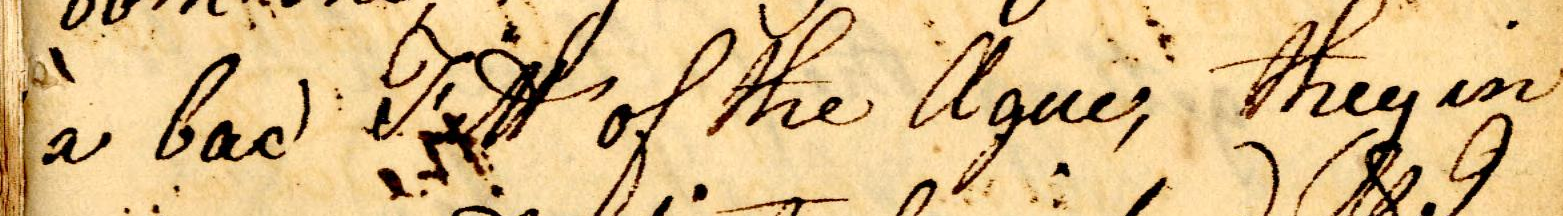a bad Fitt of the Ague, they in
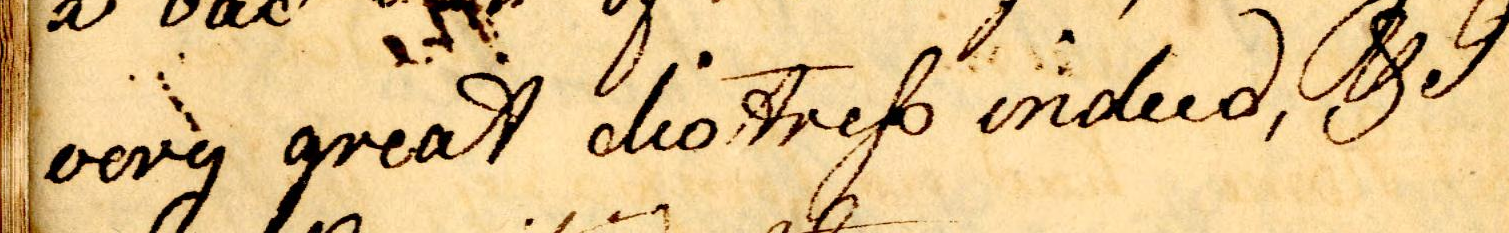very great distress indeed, & I
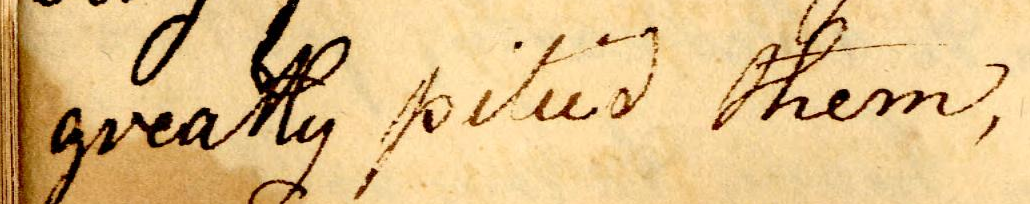greatly pitied them,
